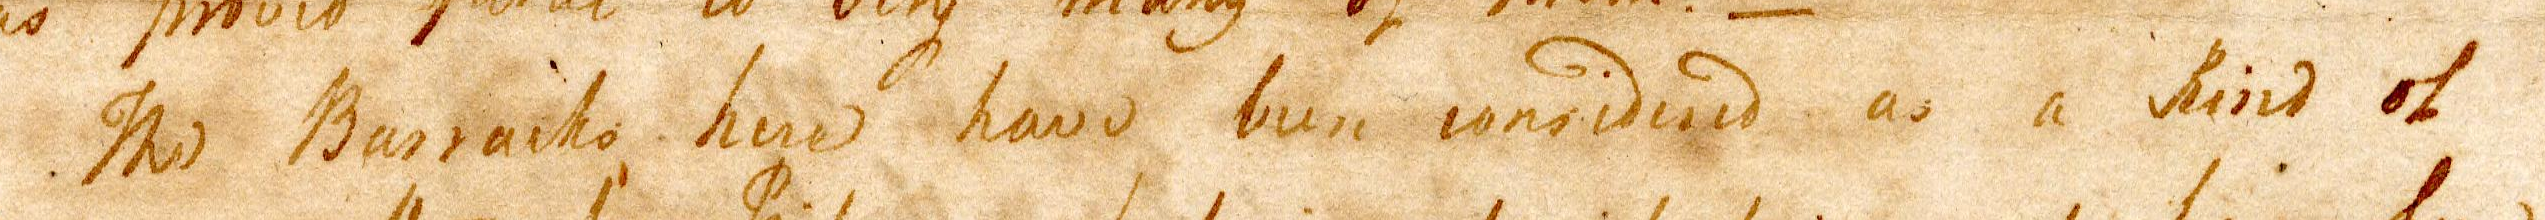The Barracks here have been considered as a Kind of
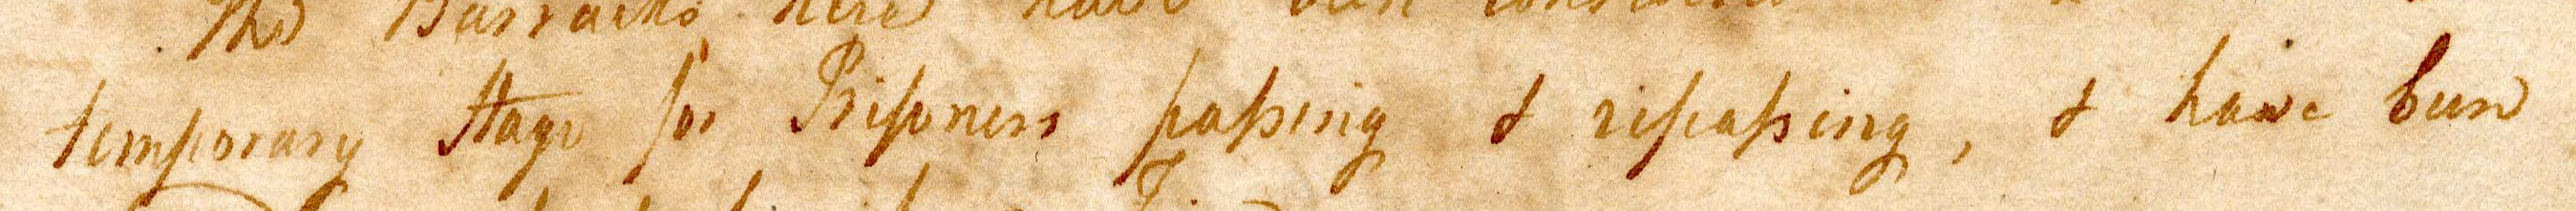temporary Stage for Prisoners passing, & repassing, & have been
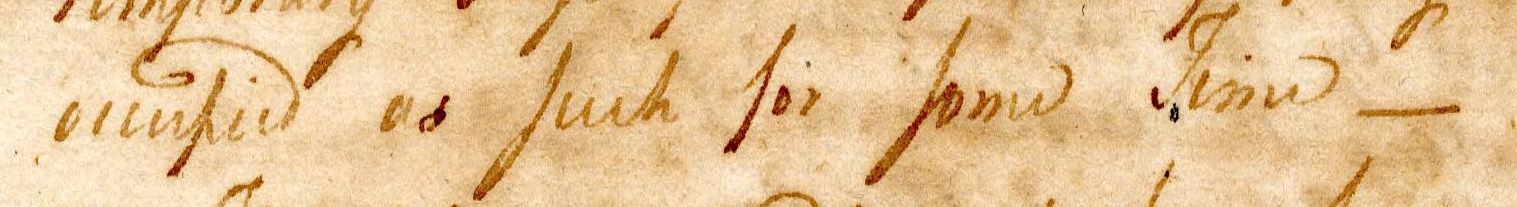occupied as such for some Time.
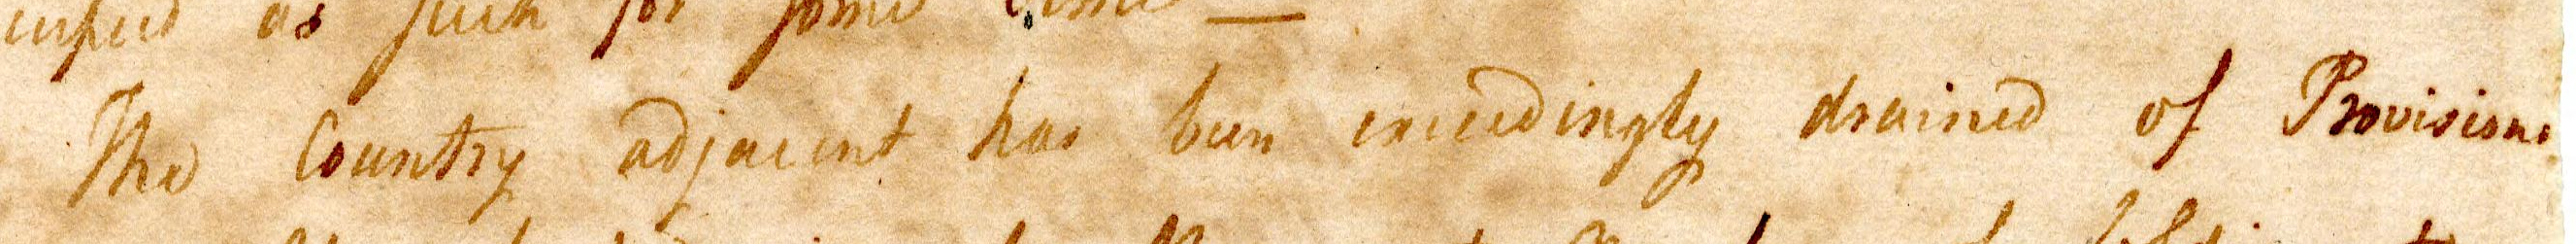The Country adjacent has been exceedingly drained of Provisions
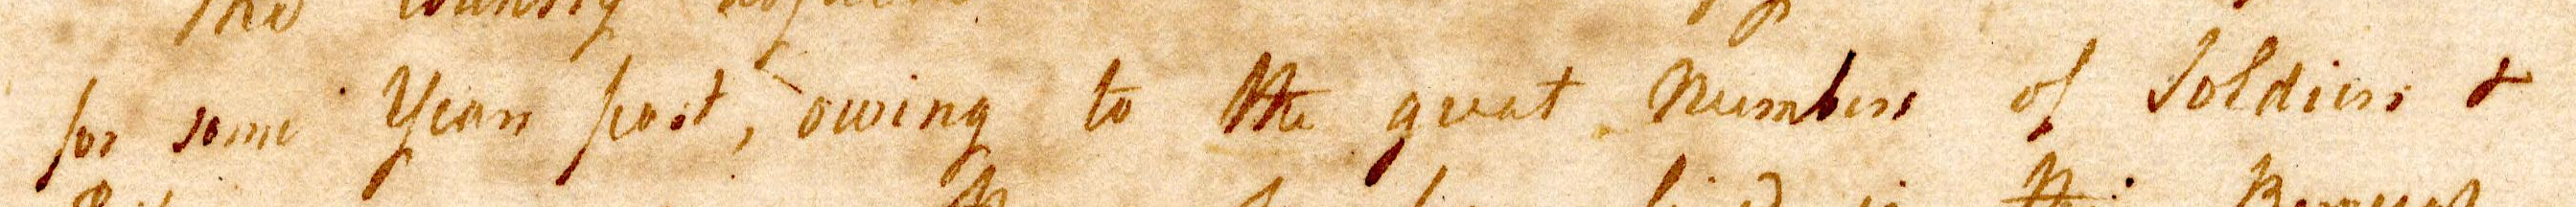for some Years past, owing to the great numbers of Soldiers &
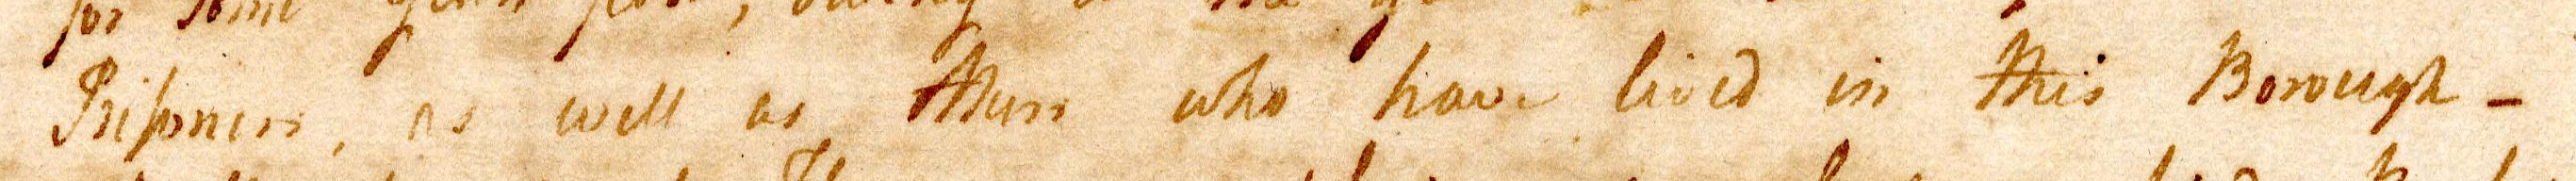Prisoners, as well as Men who have lived in this Borough
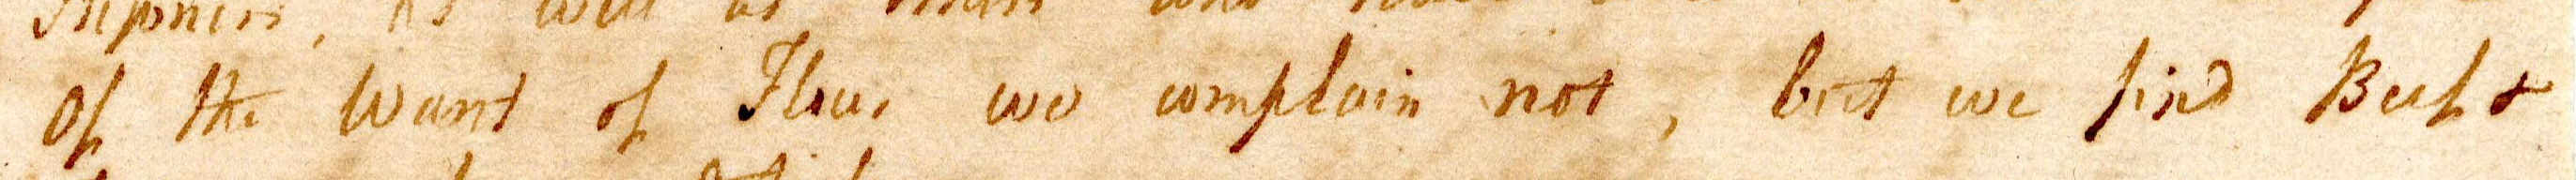of the Want of Flour we complain not, but we find Beef &
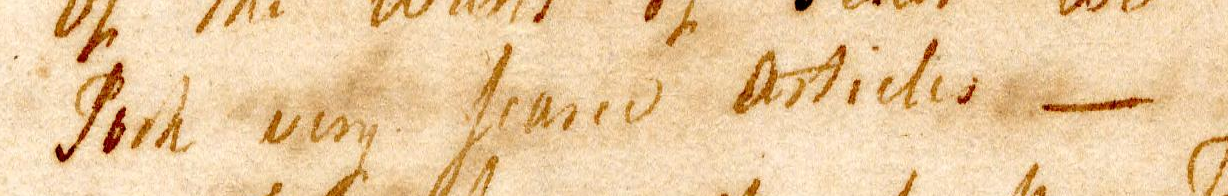Pork very scarce Articles.
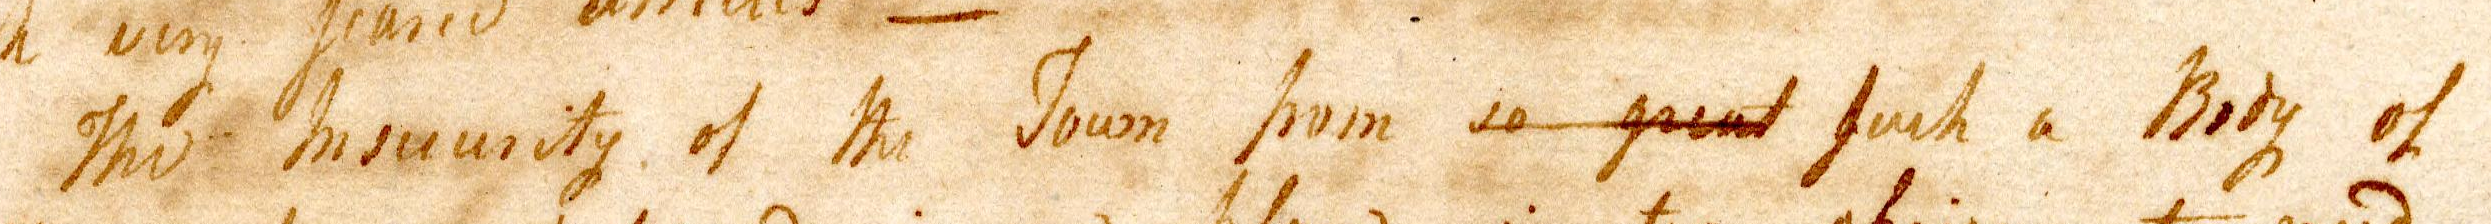The Insecurity of the Town from so great such a Body of
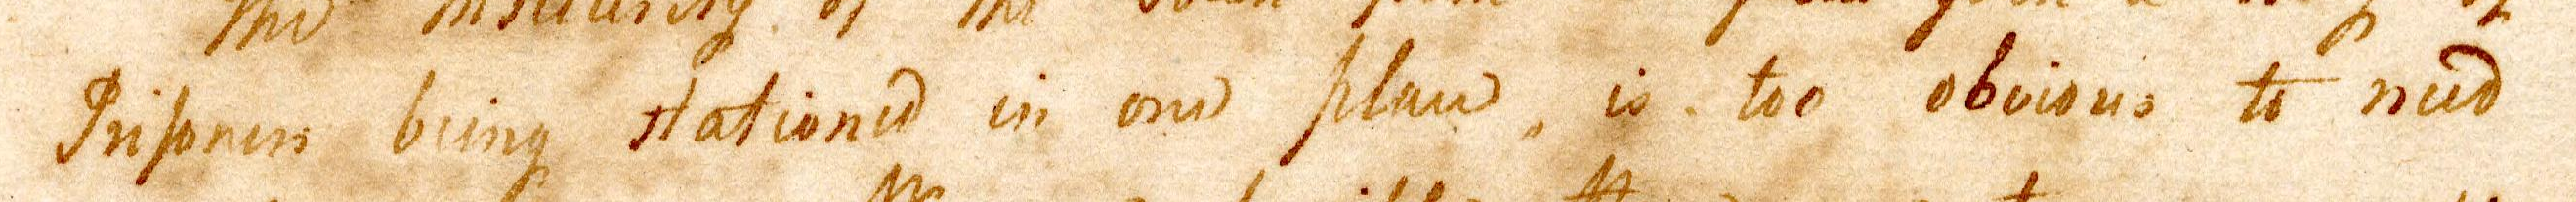Prisoners being stationed in one place, is too obvious to need
